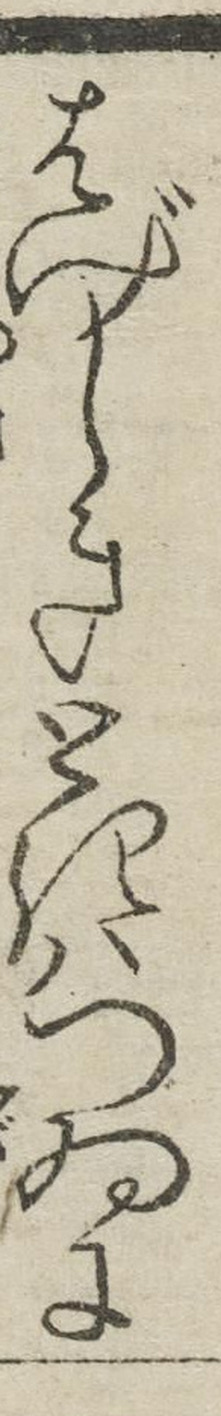はげしきときはつねに
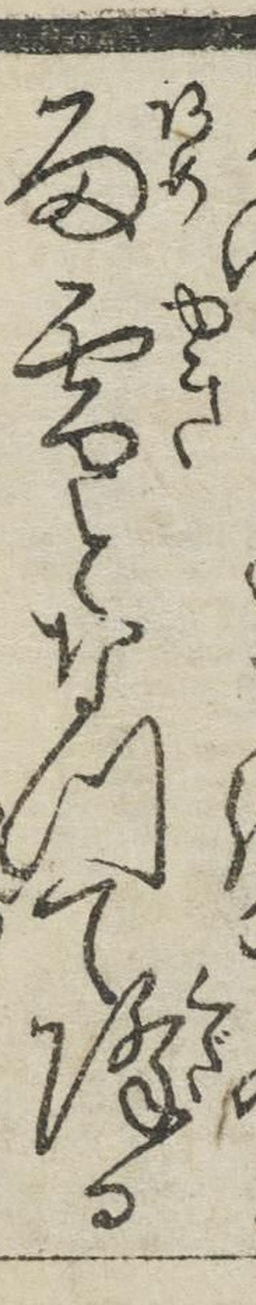雨雪となつて降る
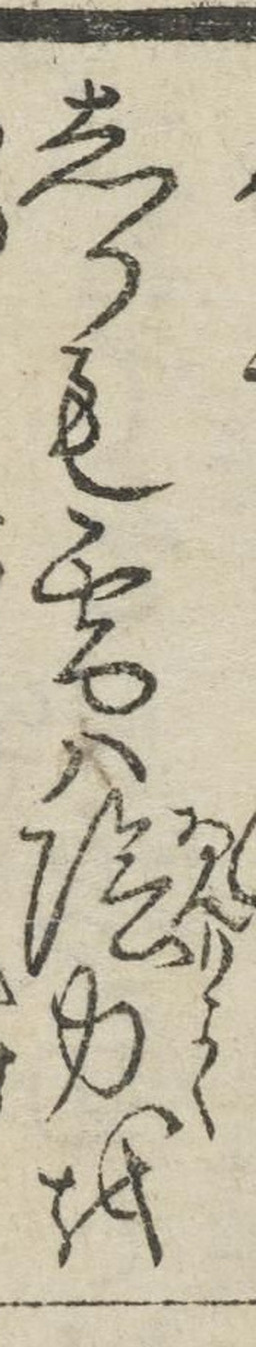しかも雪は陰力を
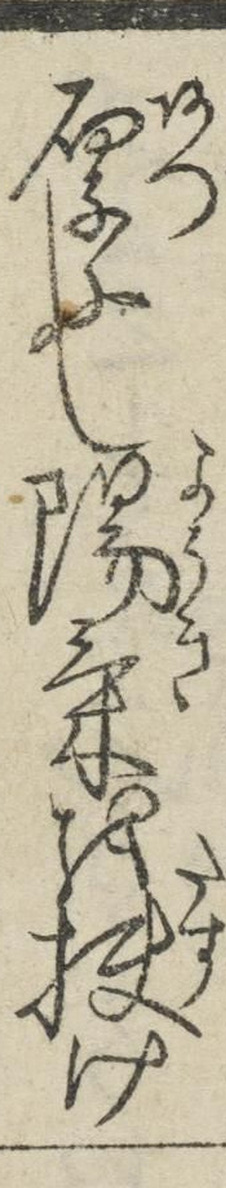厚ふし陽気を扶け
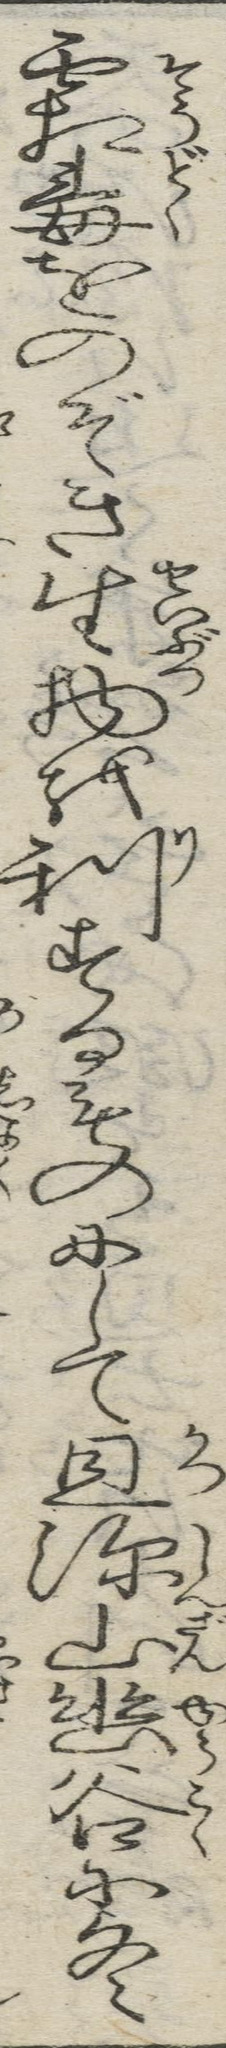霜毒をのぞき生物を利するものにして且深山幽谷に冬
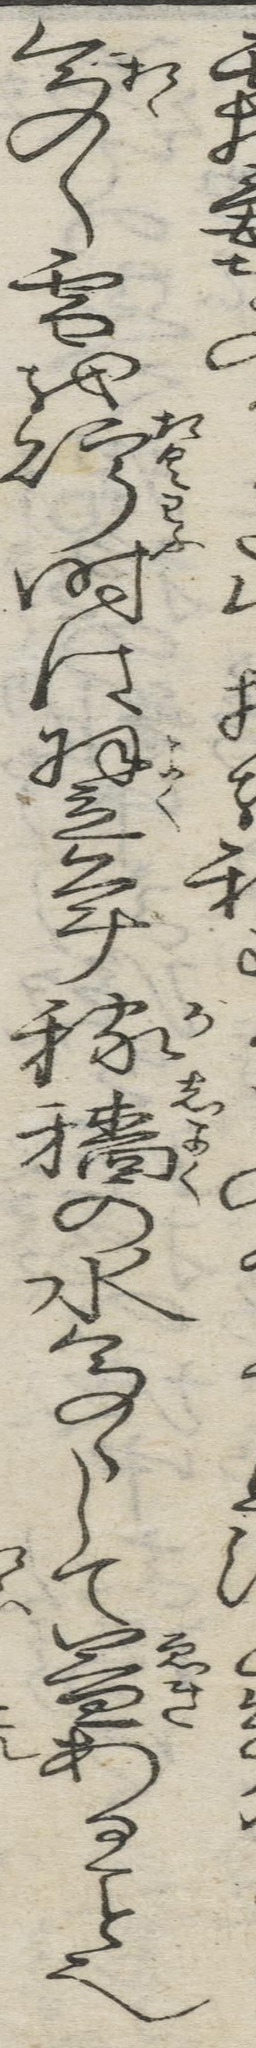多く雪を貯時は翌年稼穡の水多くして益ありとて
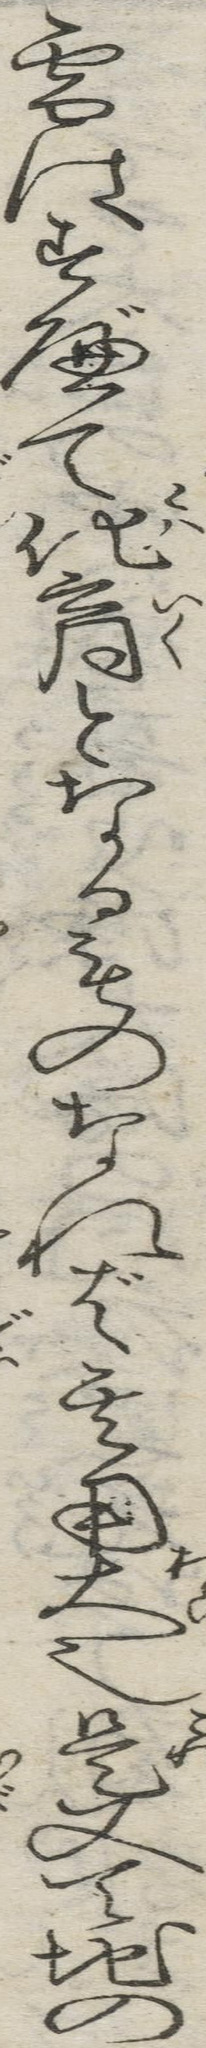雪はすべて化育となるものなれば其用大也是又天地の
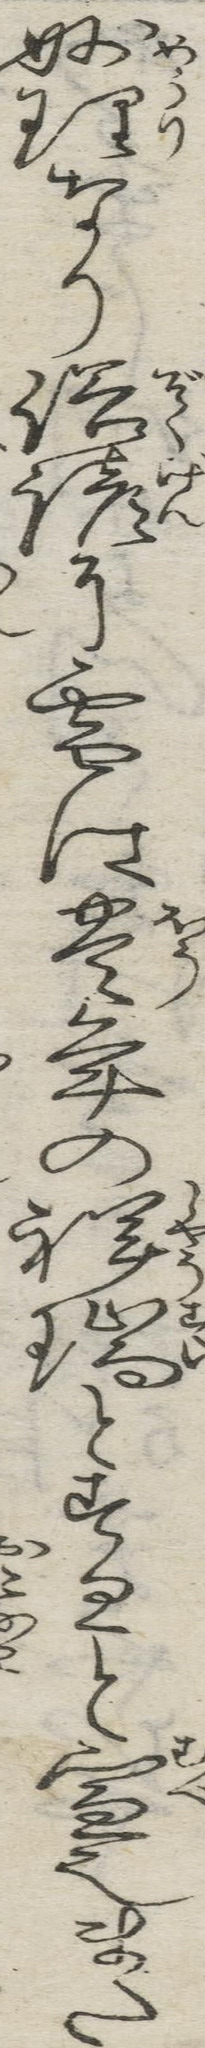妙理なり俗諺に雪は豊年の祥瑞とすること宜也また
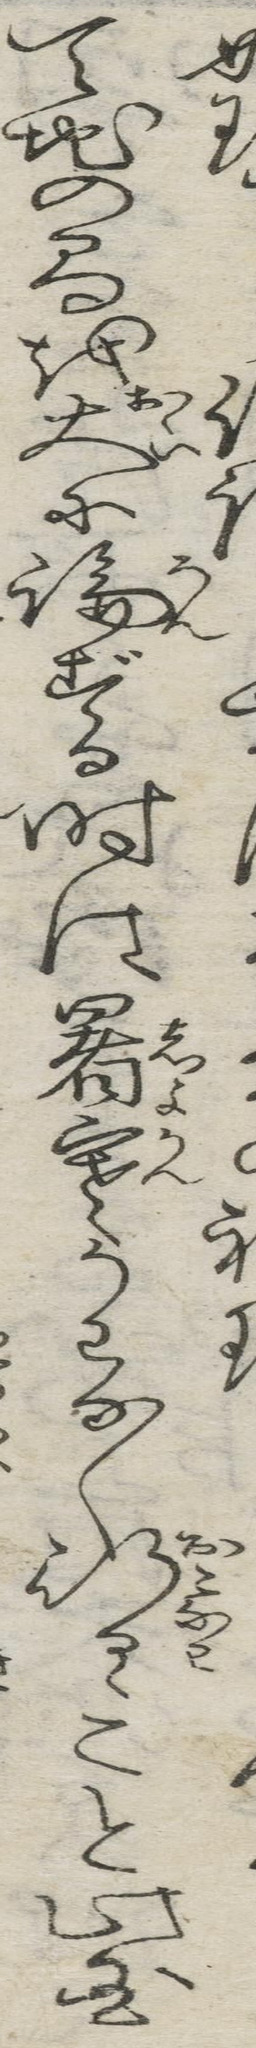天地の間を大に論ずる時は暑寒かわる〳〵行るゝこと此国
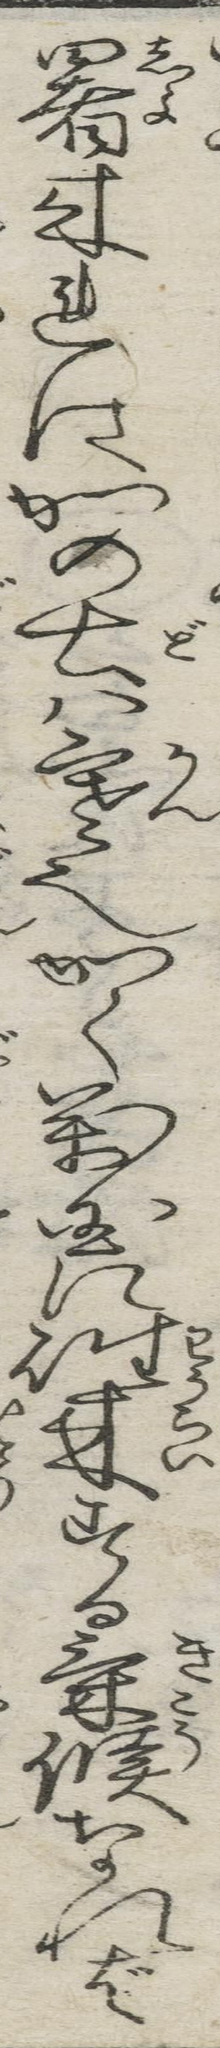暑来れはかの土は寒也かく萬国に往来する気候なれば
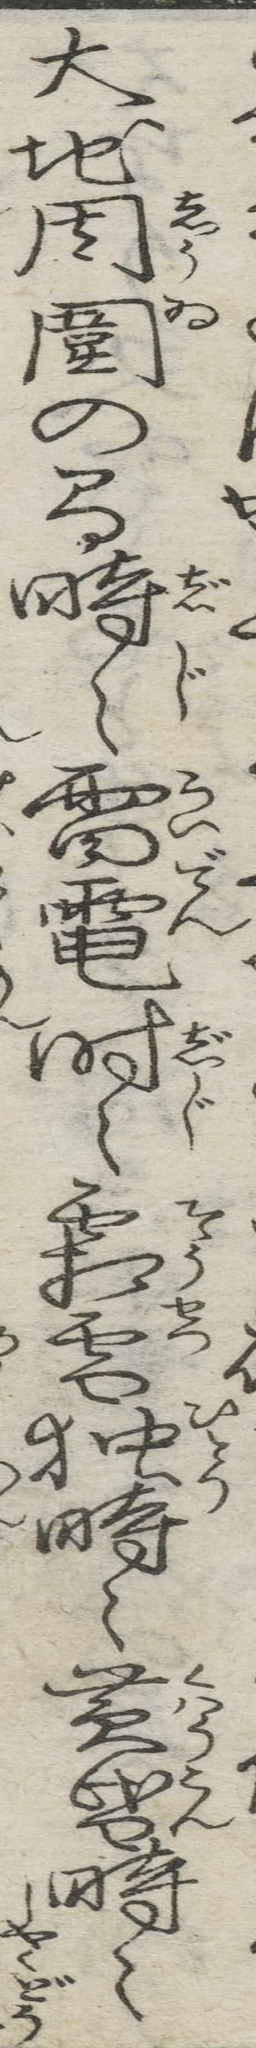大地周囲の間時々雷電時々霜雪独時々黄昏時々
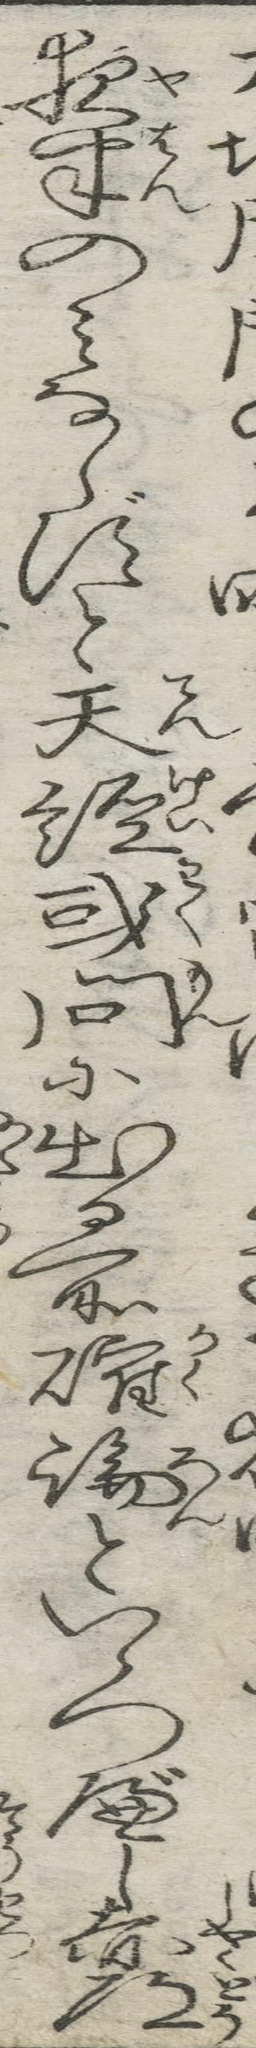夜半のみならずと天経或問に出る所確論というべし赤道
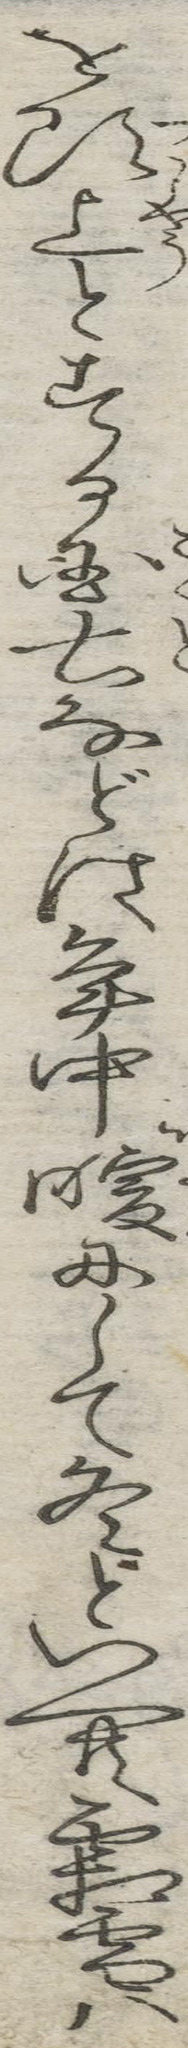を頭上とする国土などは年中暖にして冬といえ共霜雪は
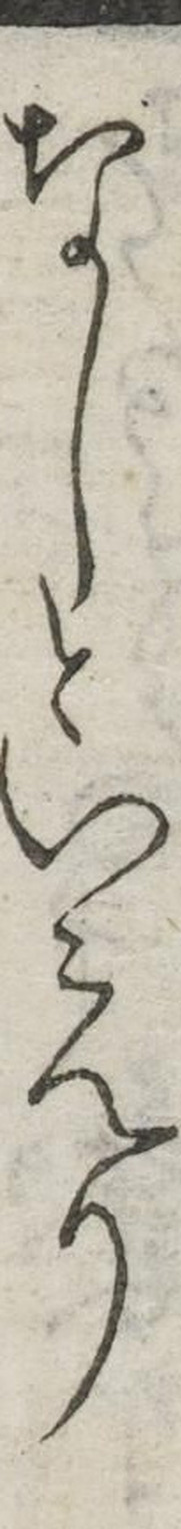なしといえり
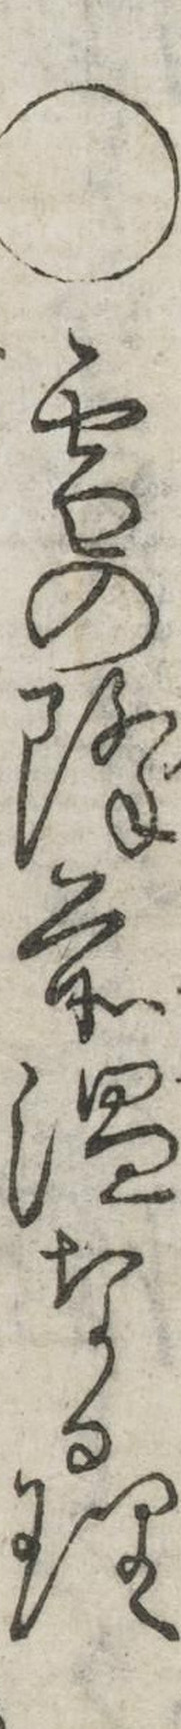〇雪の降前温なる理
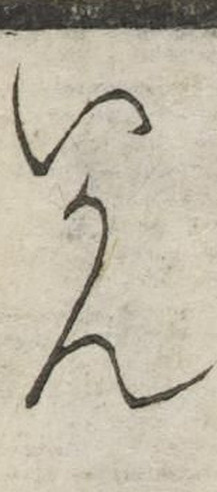いかん
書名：訓蒙天地辨　地
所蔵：東京大学地震研究所図書室 Earthquake Research Institute Library, The University of Tokyo, JAPAN
